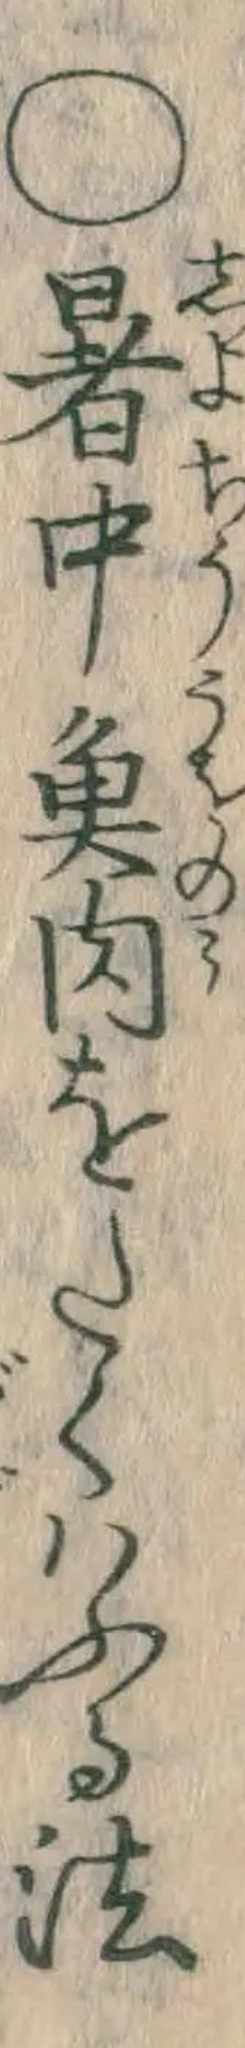○暑中魚肉をたくはふる法
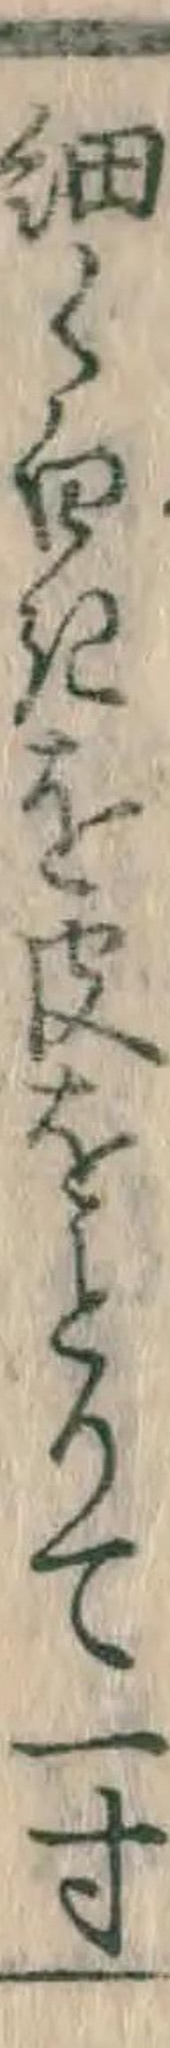細く白きを皮をとりて一寸
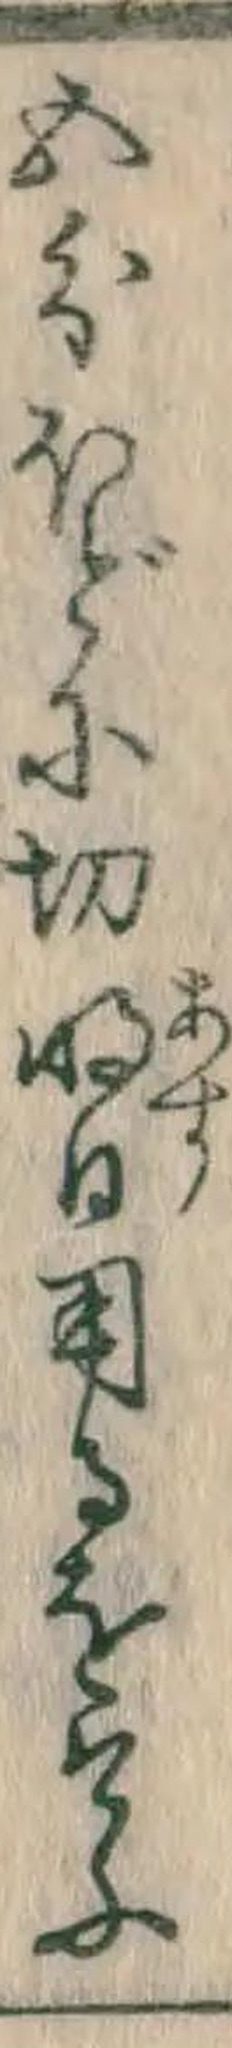五分ほどに切明日用るをけふ
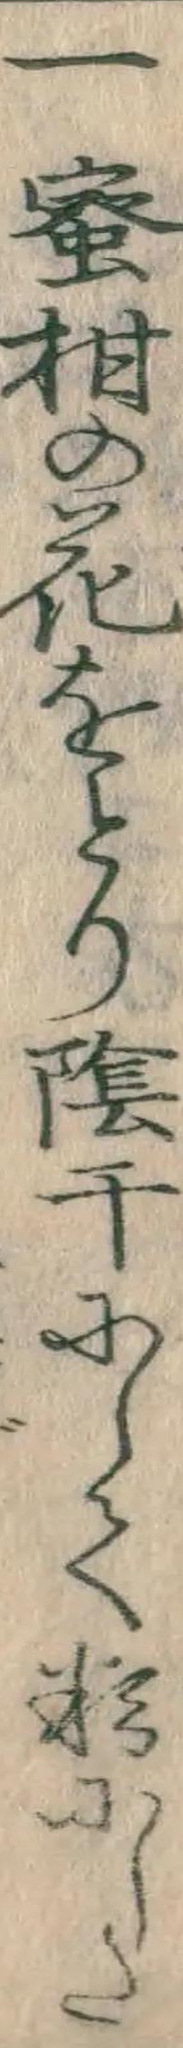一蜜柑の花をとり陰干にして粉にした
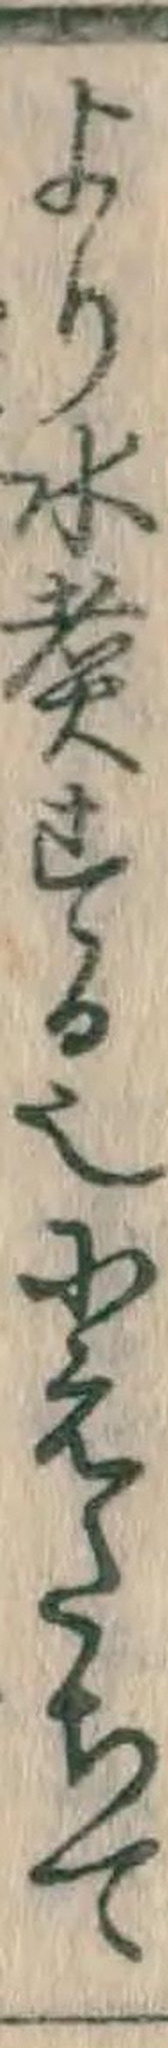より水煮する也にえたちて
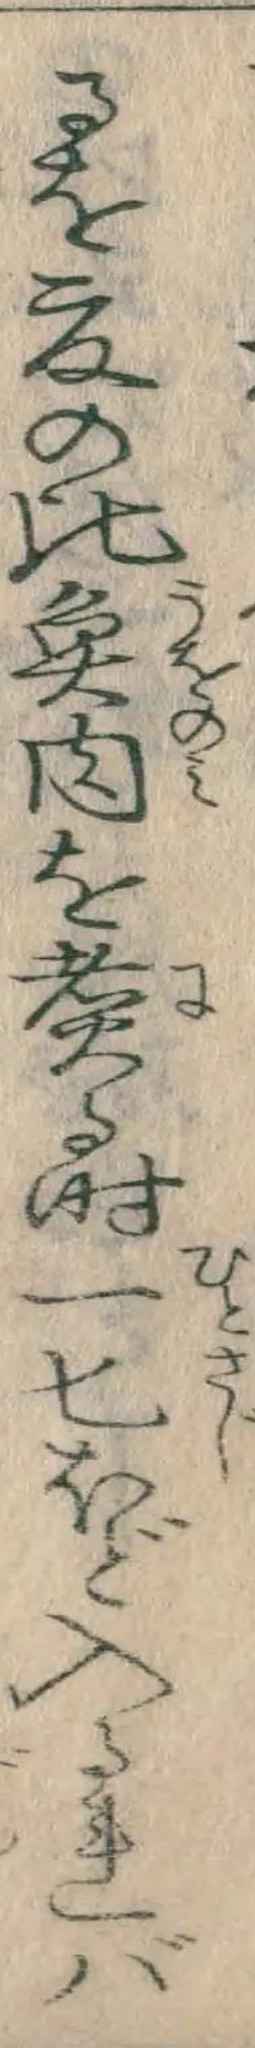るを夏の比魚肉を煮る時一匕ほど入るれば
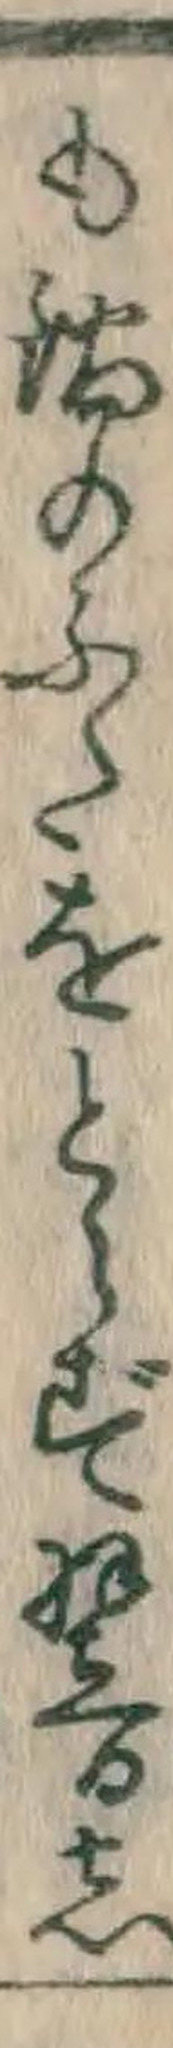も鍋のふたをとらず翌日し
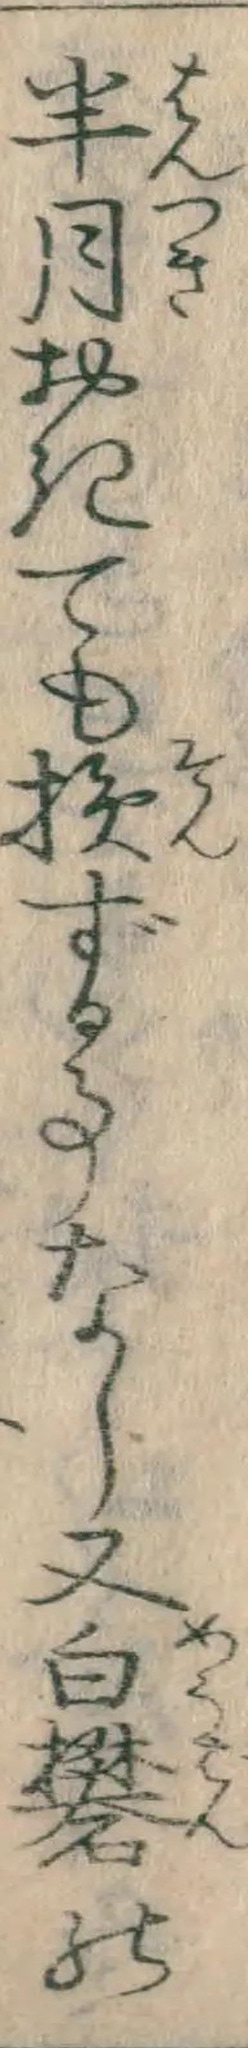半月おきても損ずる事なし又白礬の
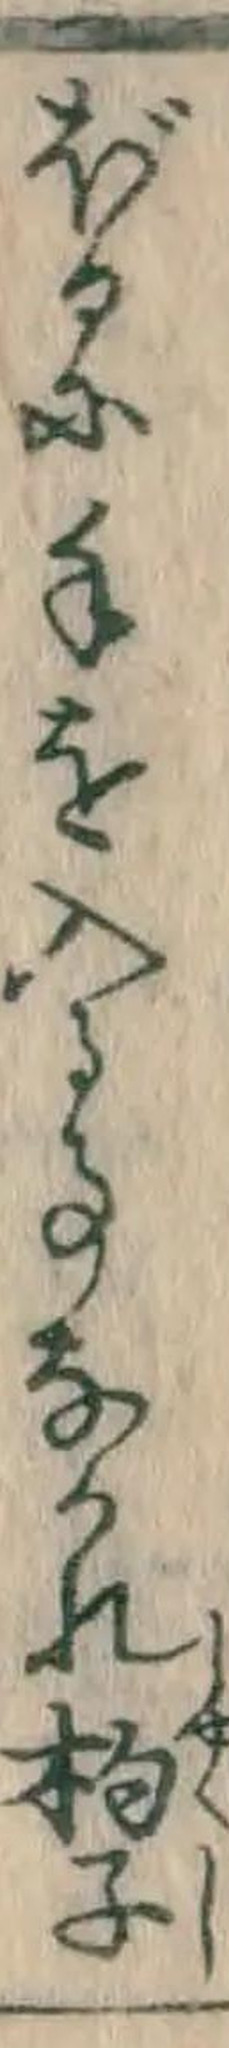ぼるに手を入る事なかれ杓子
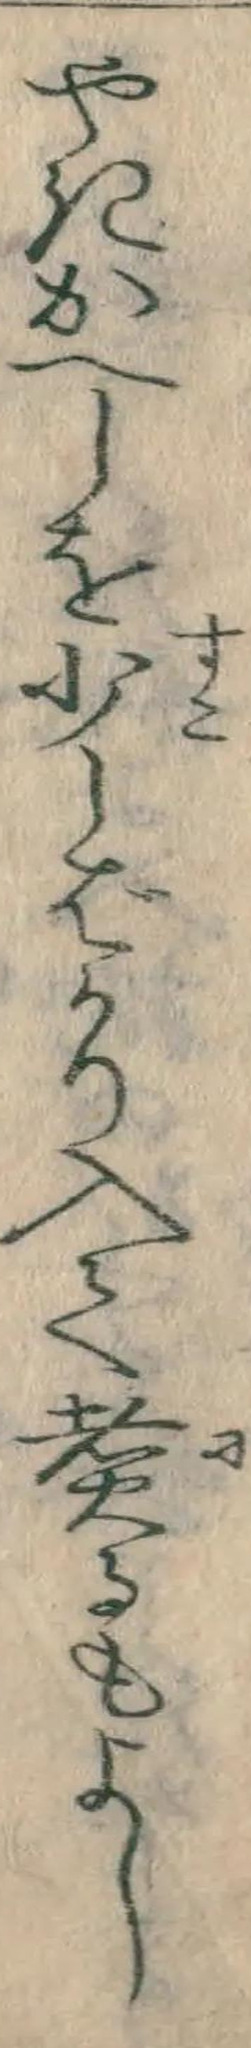やきかへしを少しばかり入て煮るもよし
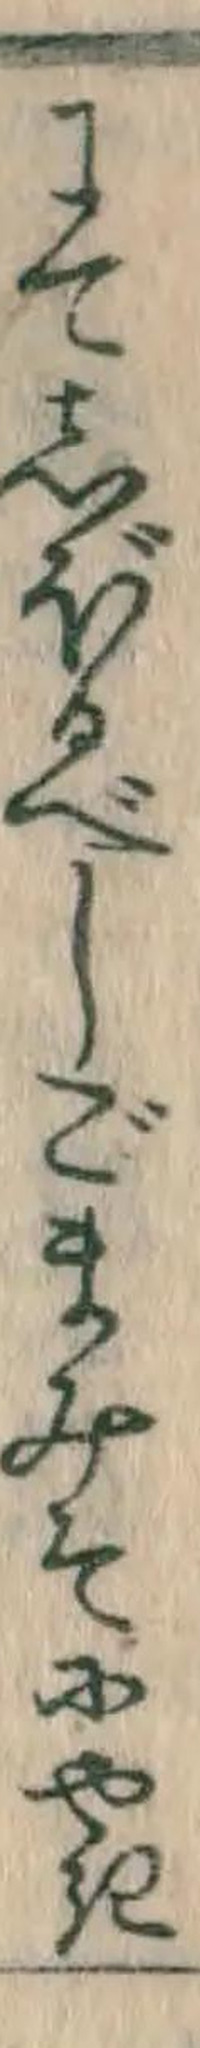にてしぼるべしごまみそにやき
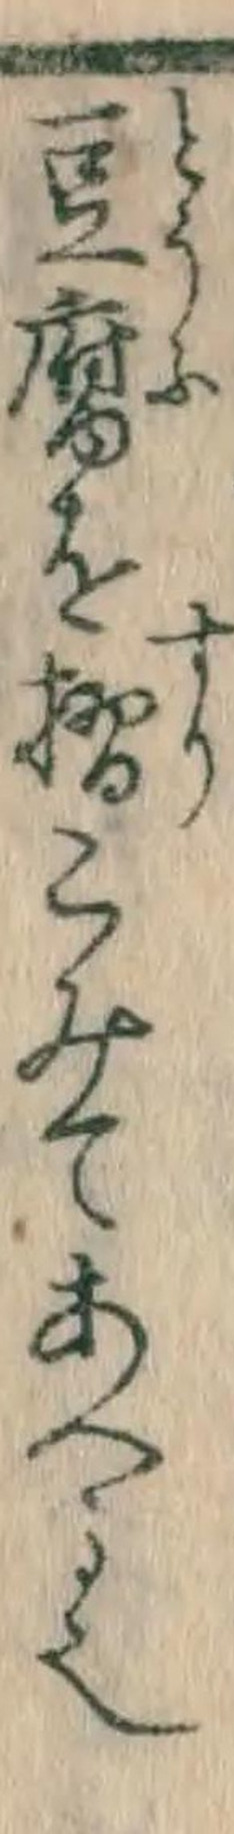豆腐を摺こみてあへる也
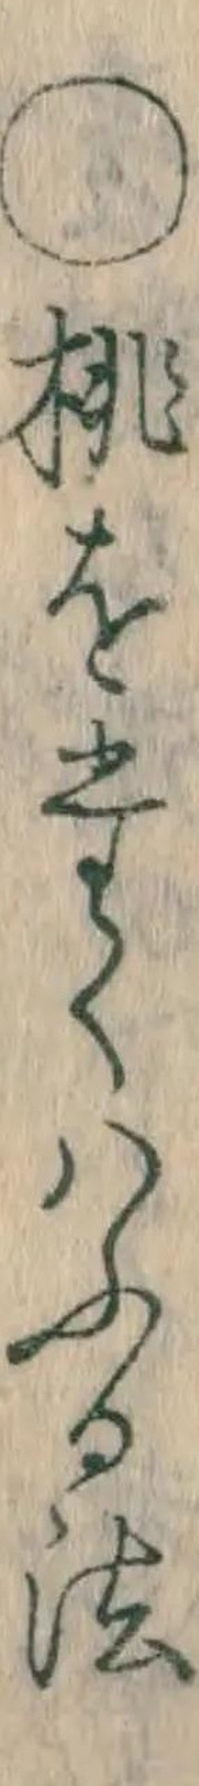○桃をたくはふる法

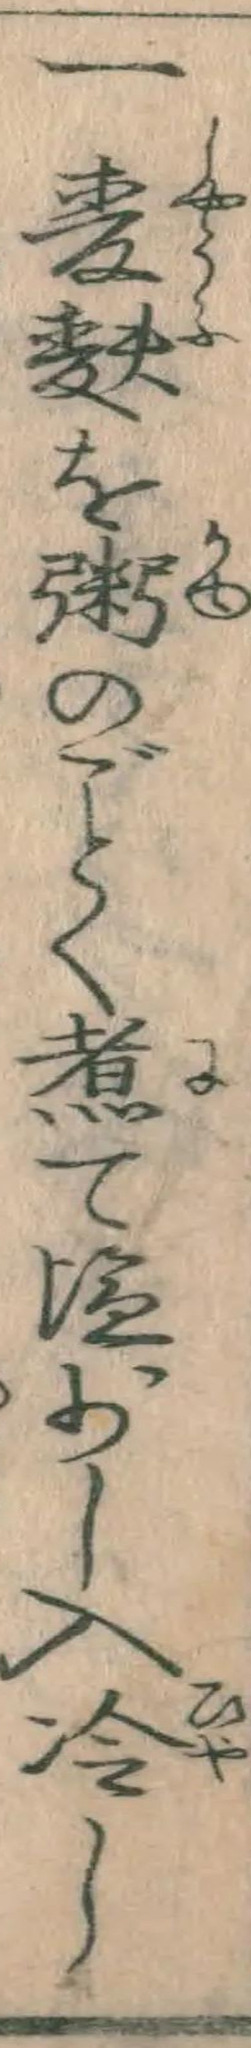一麦麩を粥のごとく煮て塩少し入冷し
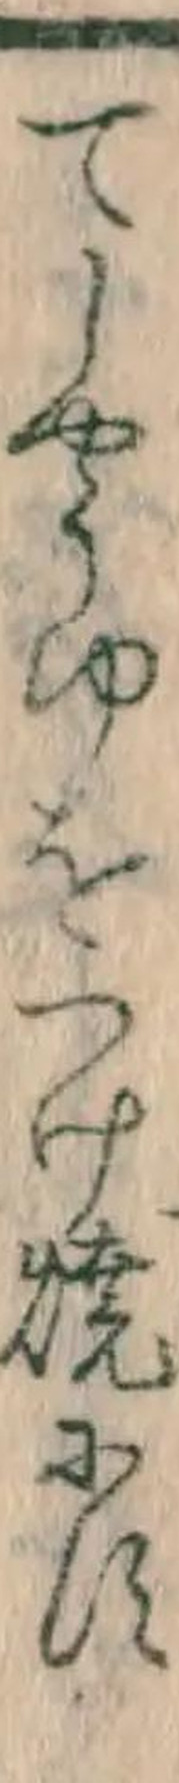てしやうゆをつけ焼にす
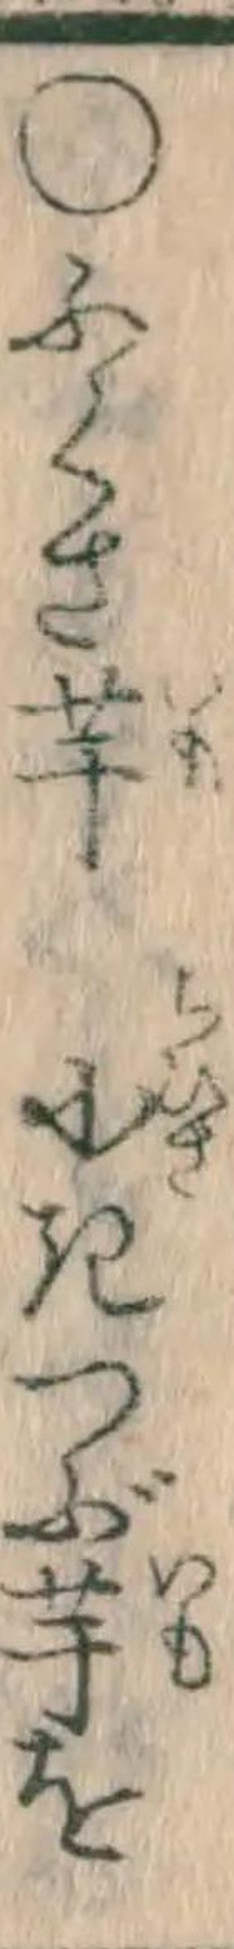○ふくさ芋小きつぶ芋を
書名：広益秘事大全 3巻. [5]
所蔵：国立国会図書館 National Diet Library, JAPAN
